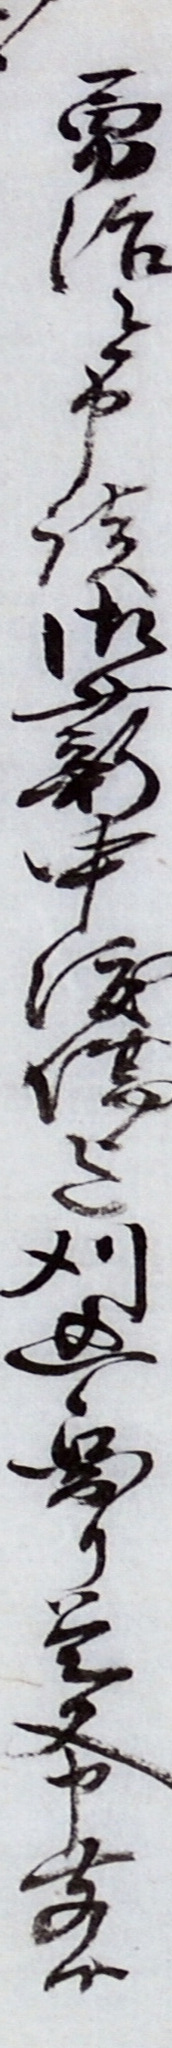勇治と申談御薪中渡場迄刈込候図り是又申聞候
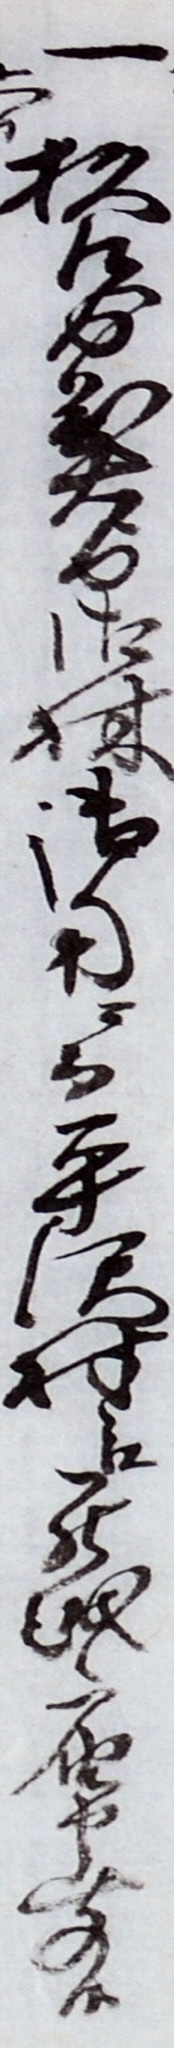一杉左衛門義右衛門御林御用ニ而平沢村江罷越候届申聞候
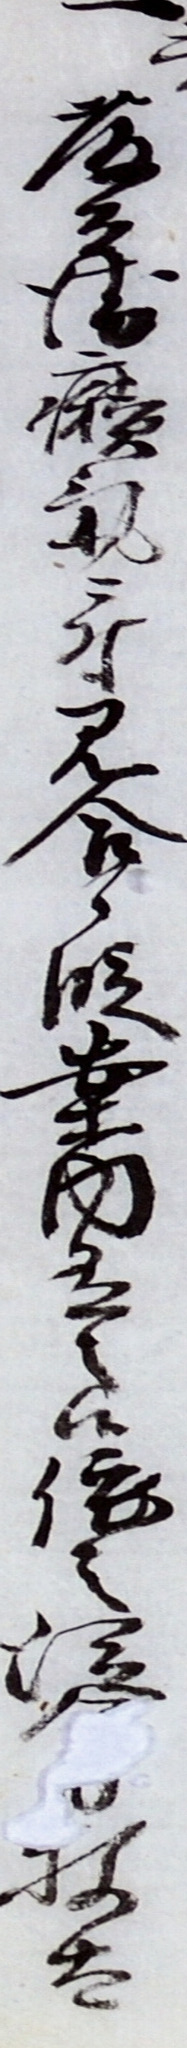一藤兵衛病気ニ付見合候段案内有之候依之従今日牧太
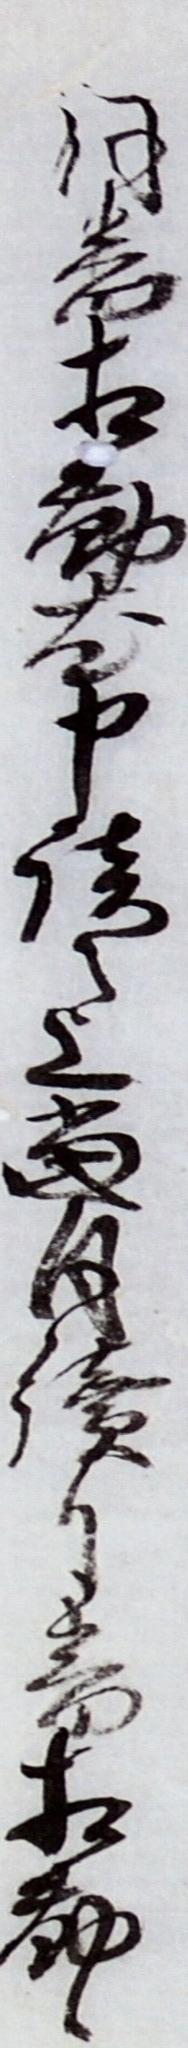月番相勤尤申談之上当月続引番相勤候
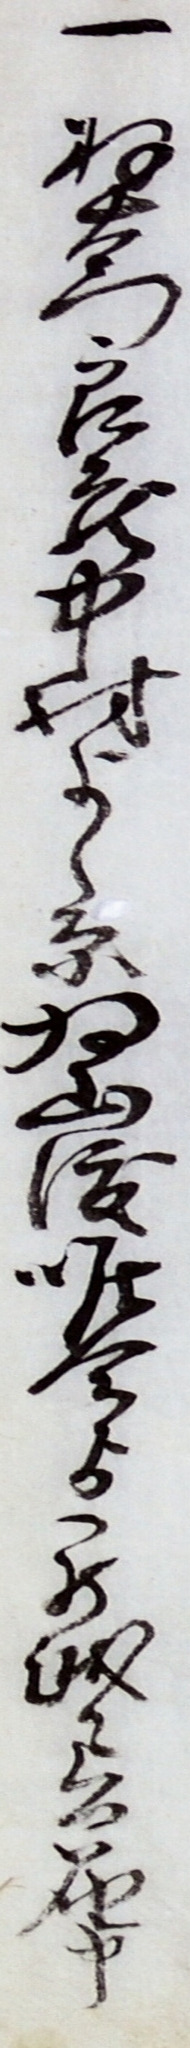一羽右衛門良蔵中村よし原為山渡唯今ゟ罷越候旨届申

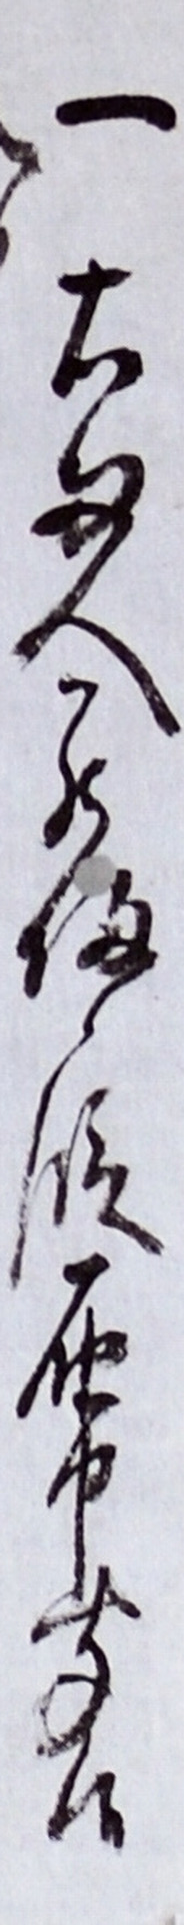一右両人罷帰候段届申聞候
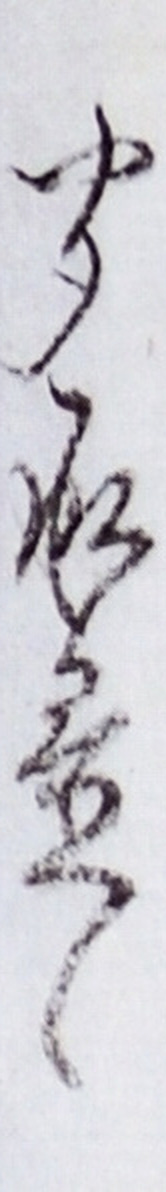聞承置候
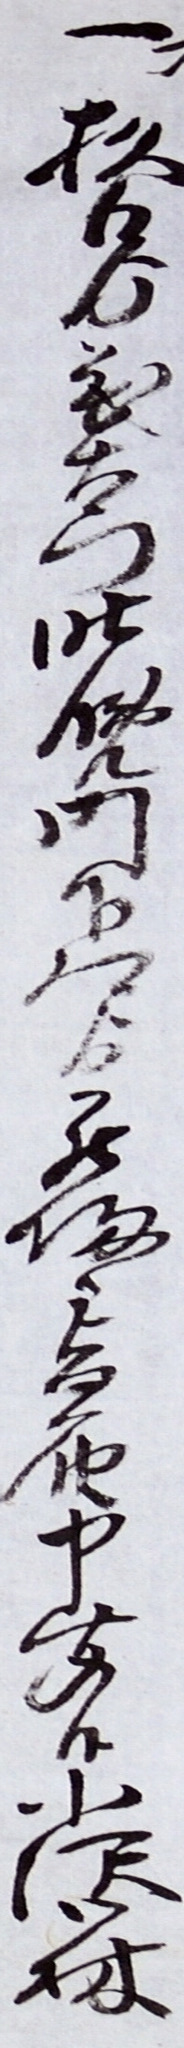一杉左衛門儀右衛門昨晩川下郷より罷帰候旨届申聞候小沢御林
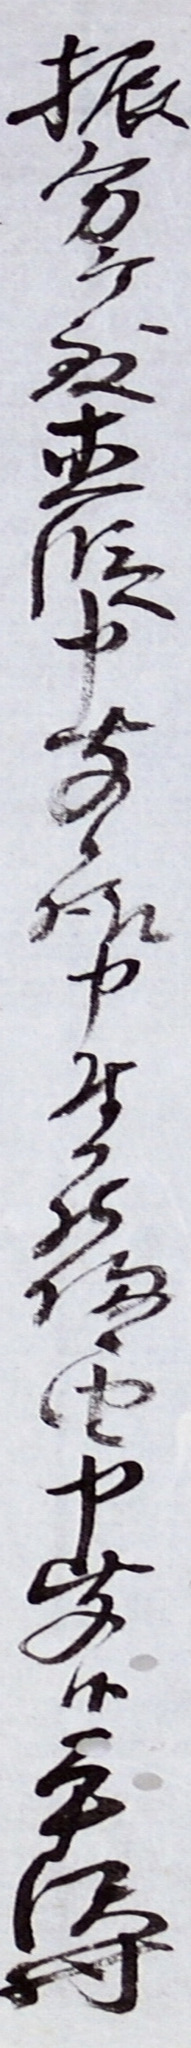振分ヶ敷直段申聞候様申付候罷帰候由申聞候平沢村
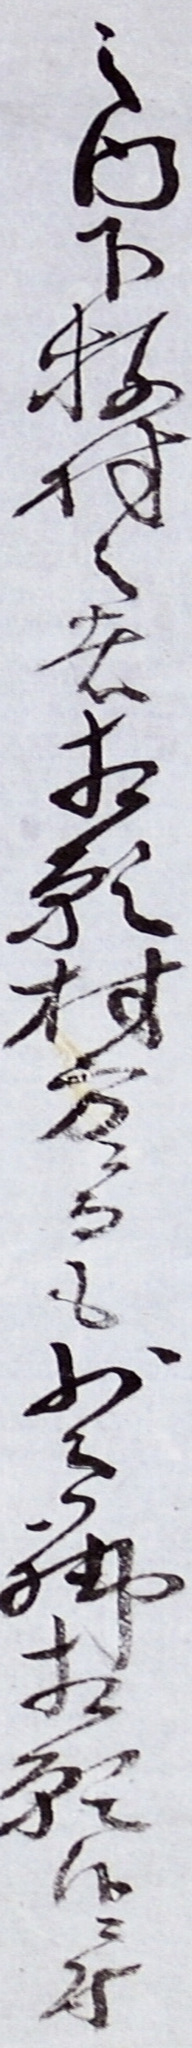之内下牧村之者相願村方ニ而も少々御払相願候ニ付
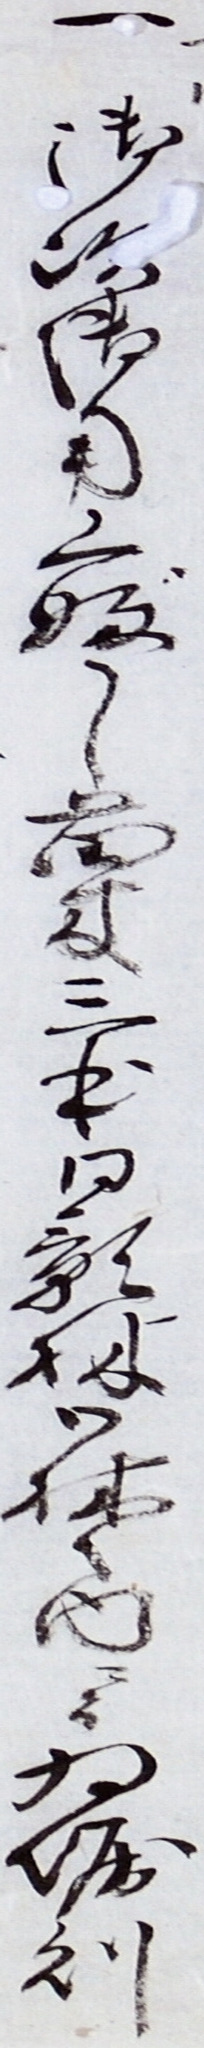一御次御用こぶし苗木三本日影林御林之内ニ而為堀則
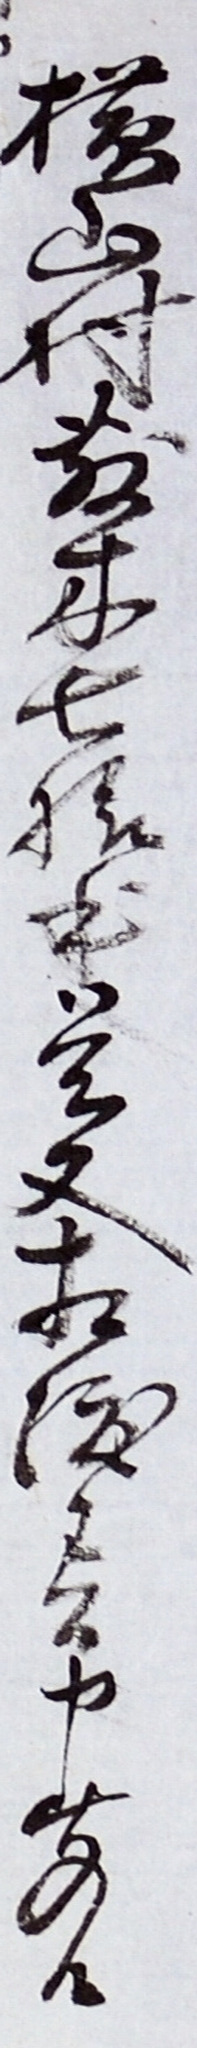横山村散木七拾本是又相渡候旨申聞候
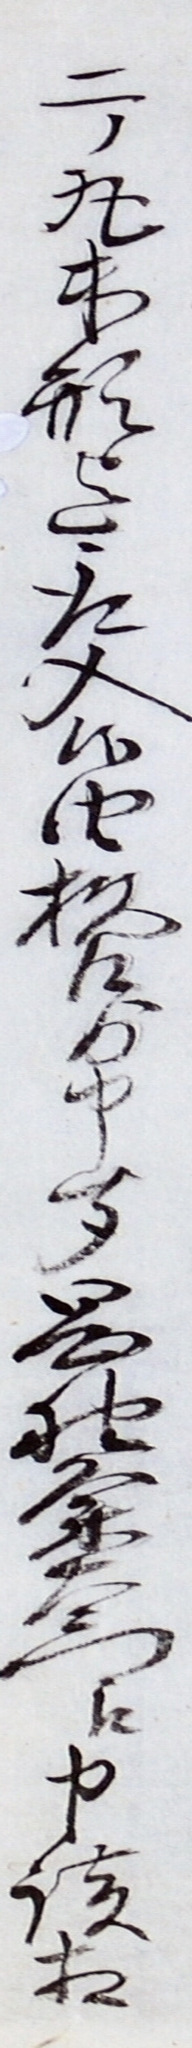二ノ丸木形迄取入候由杉左衛門申聞岡野粂右衛門江申談相
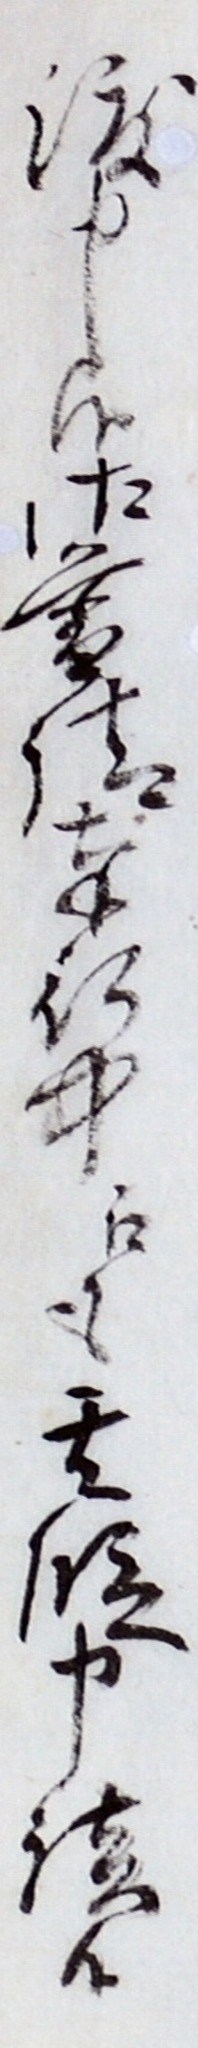渡申候御普請奉行中江も其段申談候
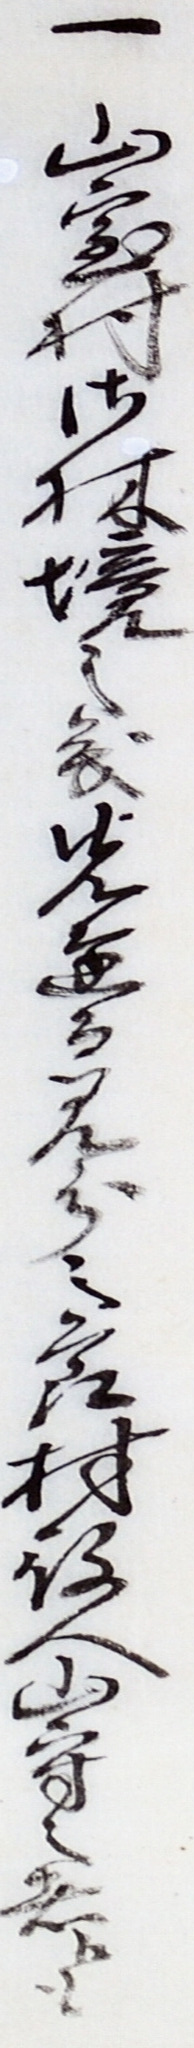一山室村御林境之義先達而見分之節村役人山守之者江も
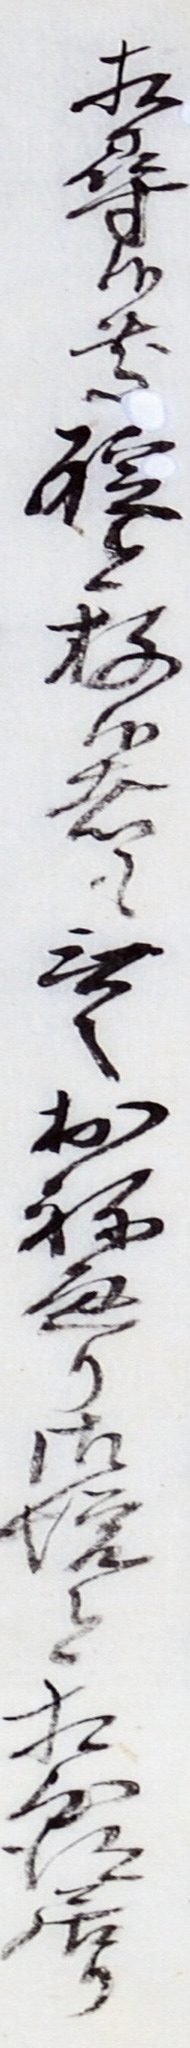相尋候処聢と存候者も無之おね通り御境と相心得居り
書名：御山奉行御用控
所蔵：伊那市立高遠町図書館・合同会社AMANE
